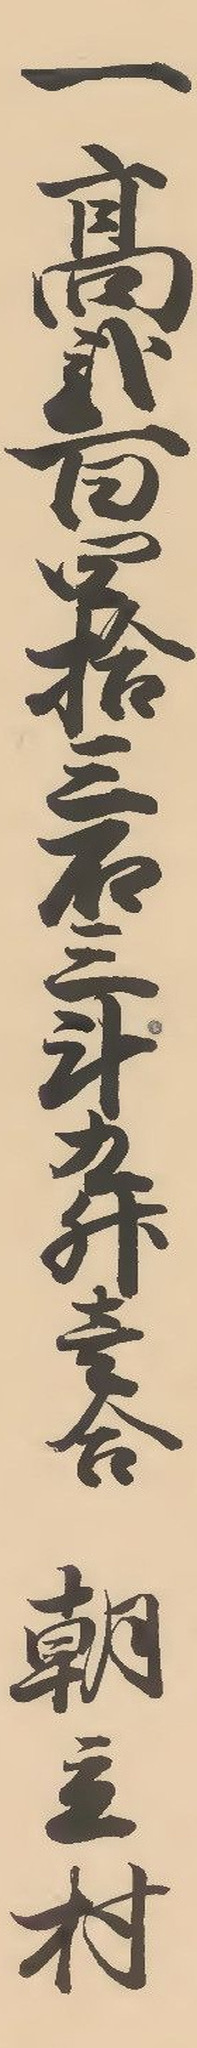一高弐百四拾三石三斗九升壱合朝立村
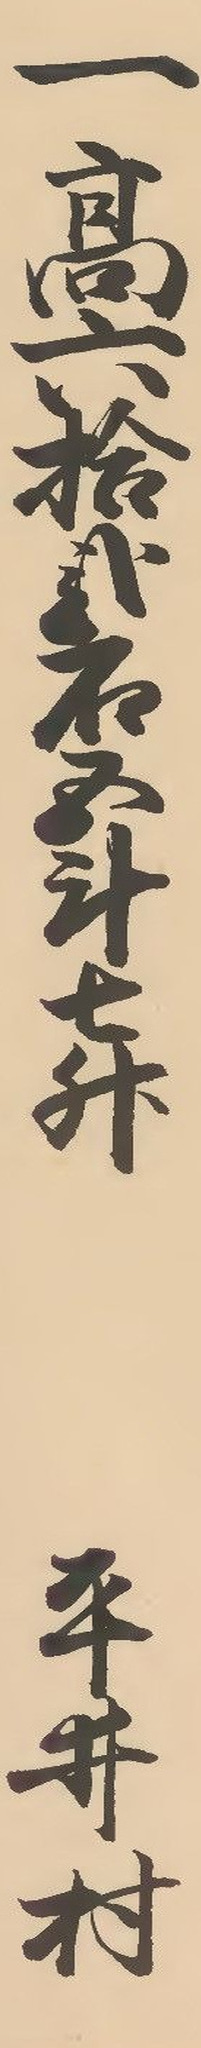一高六拾弐石五斗七升平井村
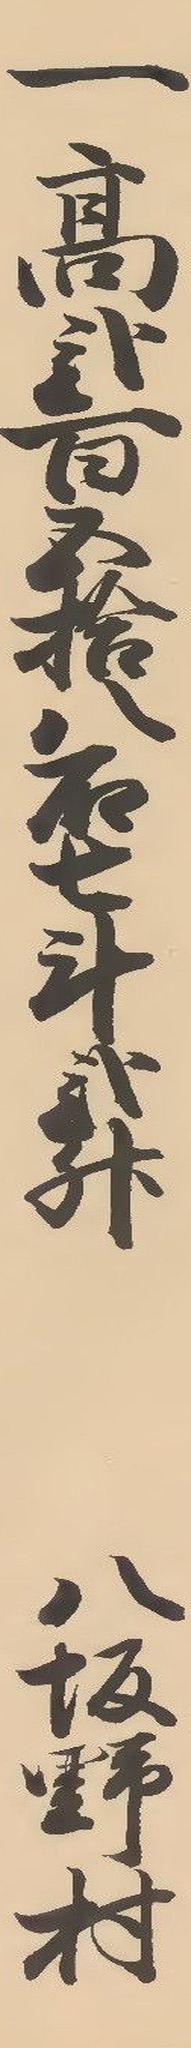一高弐百五拾八石七斗弐升八坂野村
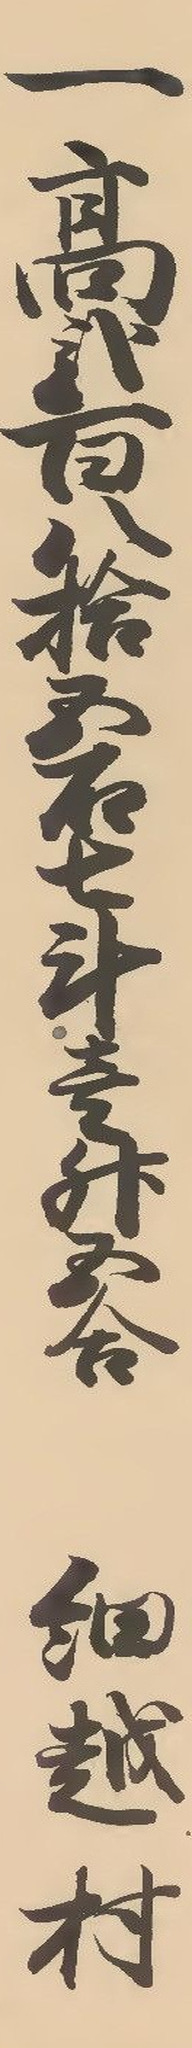一高弐百八拾五石七斗壱升五合細越村
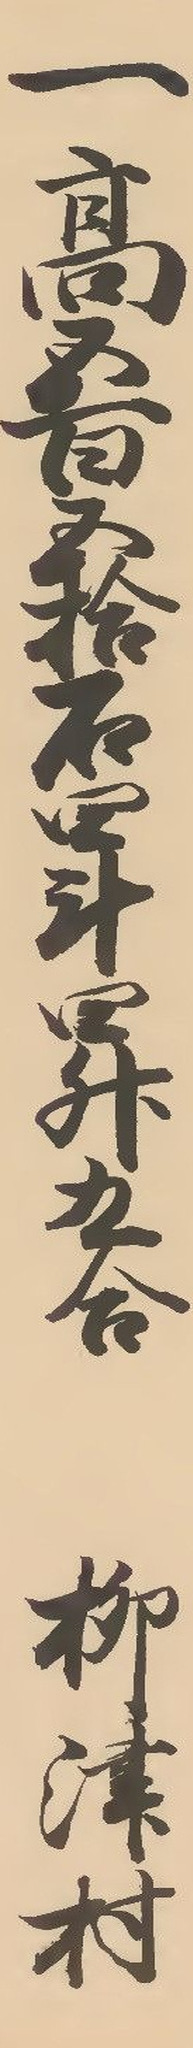一高五百五拾石四斗四升九合柳津村
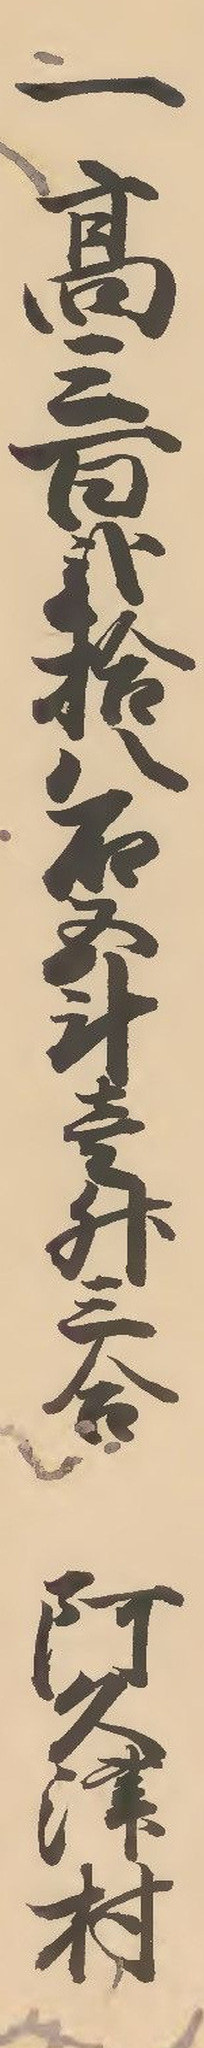一高三百弐拾八石五斗壱升三合阿久津村

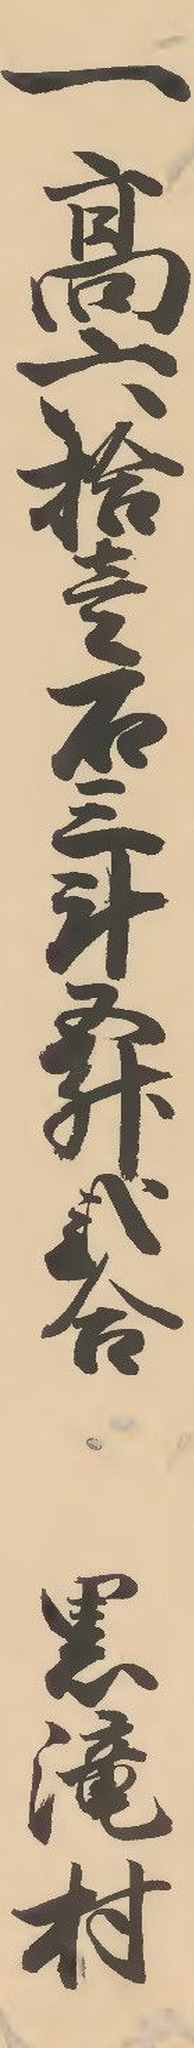一高六拾壱石三斗五升弐合黒滝村
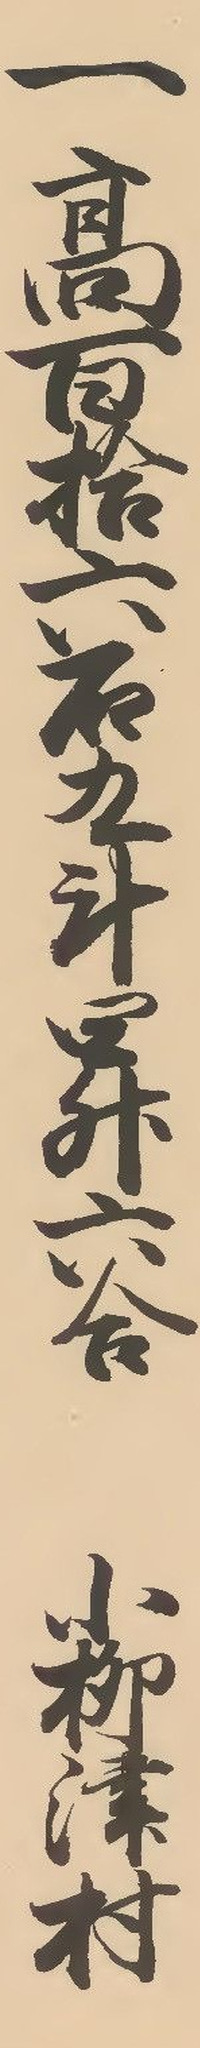一高百拾六石九斗四升六合小柳津村
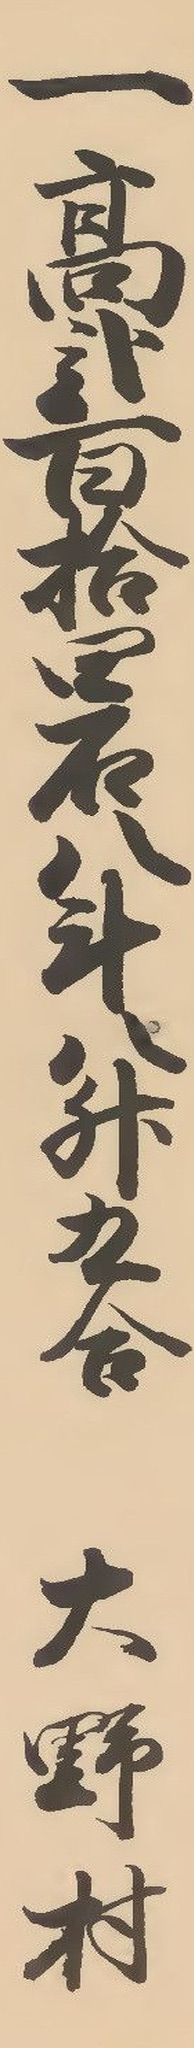一高弐百拾四石八斗八升九合大野村
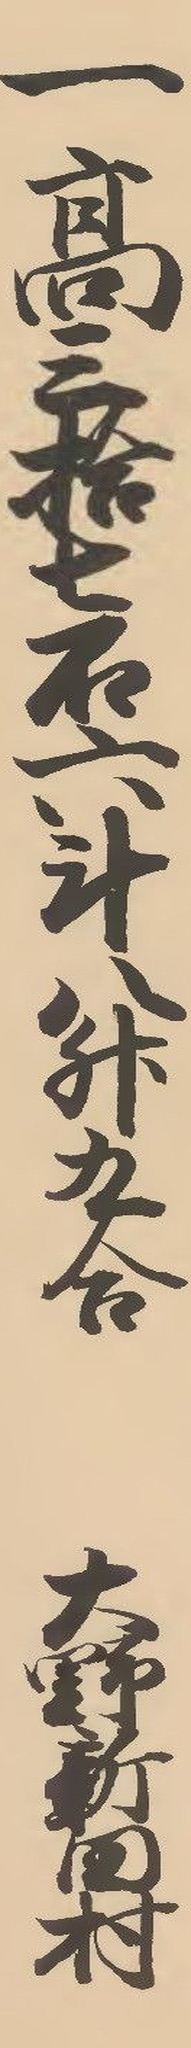一高三拾七石六斗八升九合大野新田村
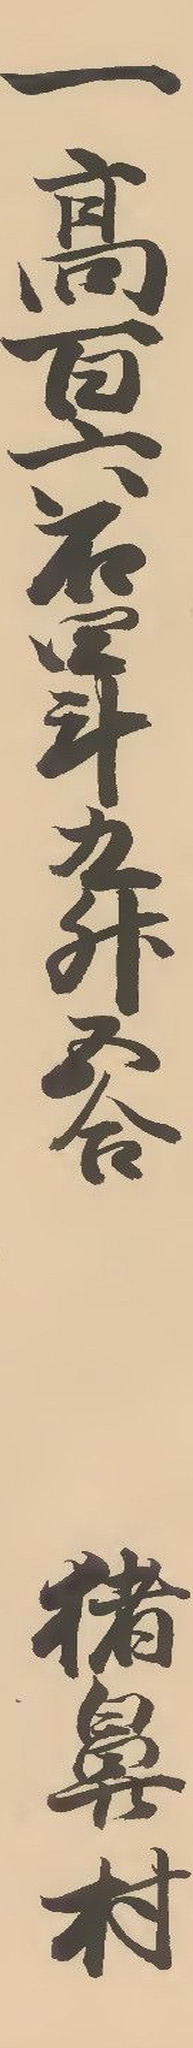一高百六石四斗九升五合猪鼻村
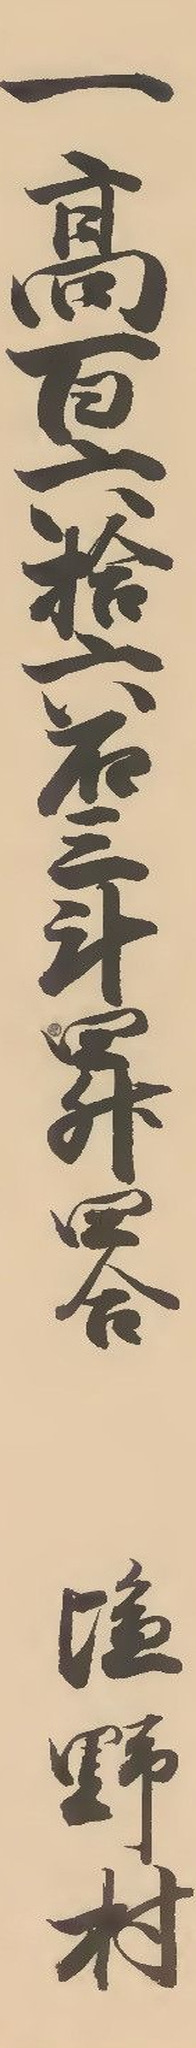一高百六拾六石三斗四升四合塩野村
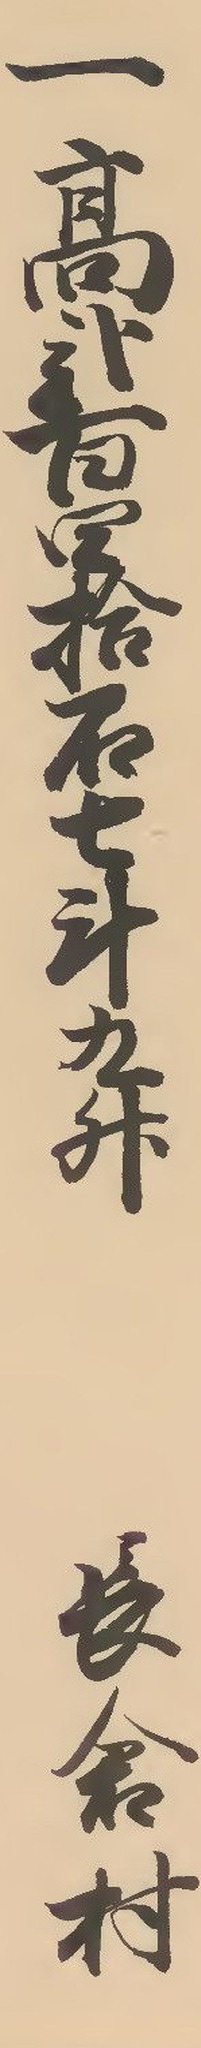一高弐百四拾石七斗九升長倉村
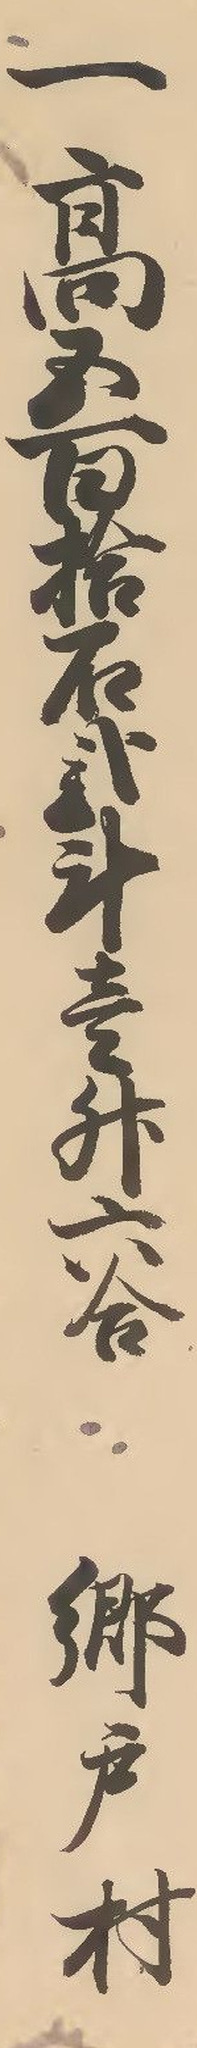一高五百拾石弐斗壱升六合郷戸村

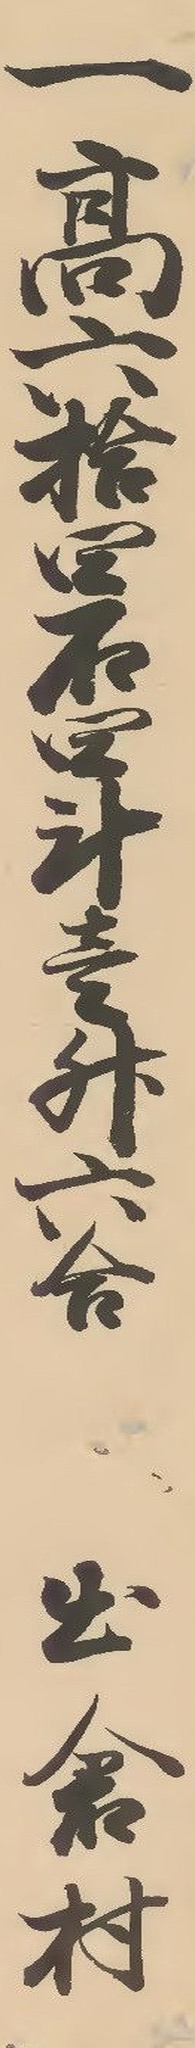一高六拾四石四斗壱升六合出倉村
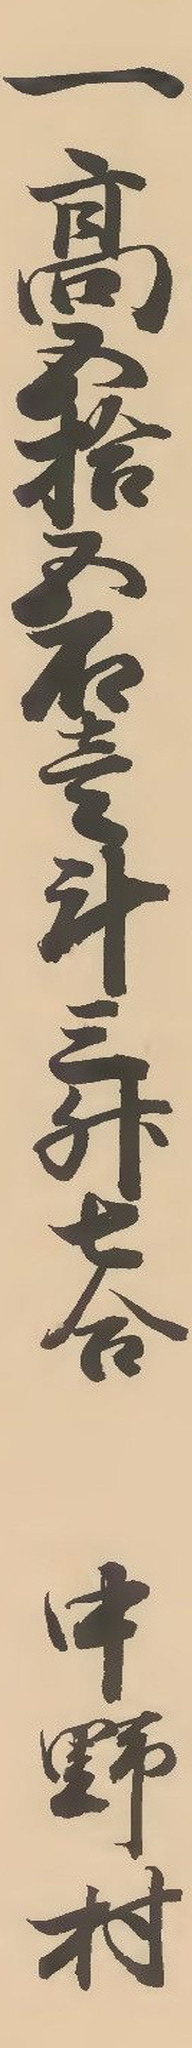一高五拾五石壱斗三升七合中野村
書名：陸奥国郷帳　１
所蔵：国立公文書館 National Archives of Japan
